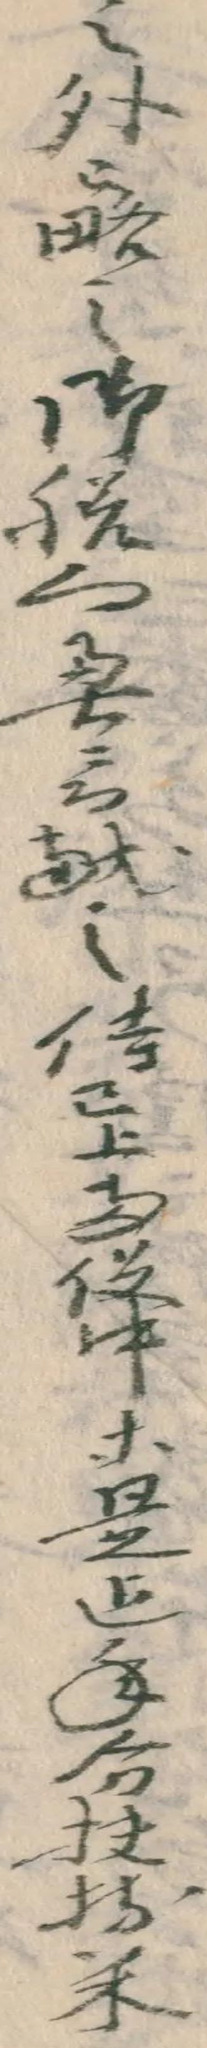之外被略之御膳向奥ニ而献之侍已上両役中等是迄年分扶持米
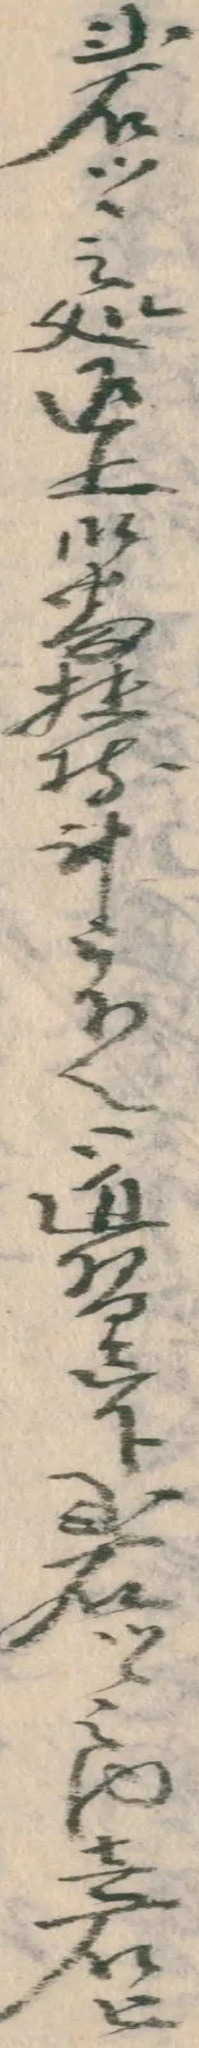弐石ツヽ之処返上御番扶持斗被下之也御近習已下弐右ツヽ之内壱石被
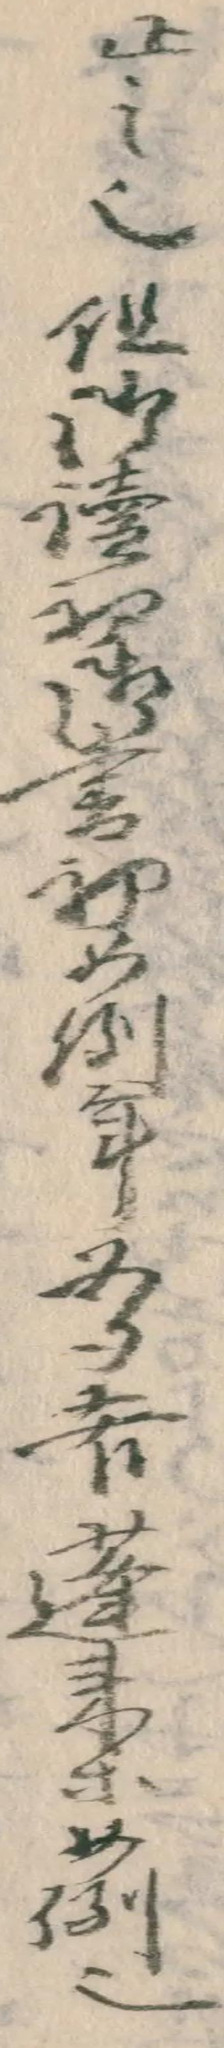止之也但御讀初御書初如例年五ツ肴蓬莱等如例也
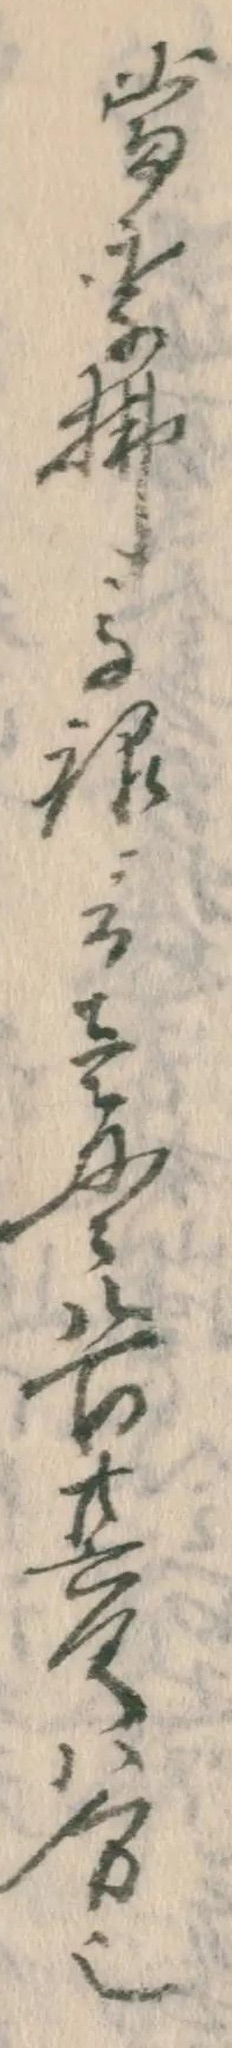當季払高銀ニ而壱貫八百廿六匁八分也
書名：賀茂社記録. 第69冊
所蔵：国立国会図書館 National Diet Library, JAPAN
